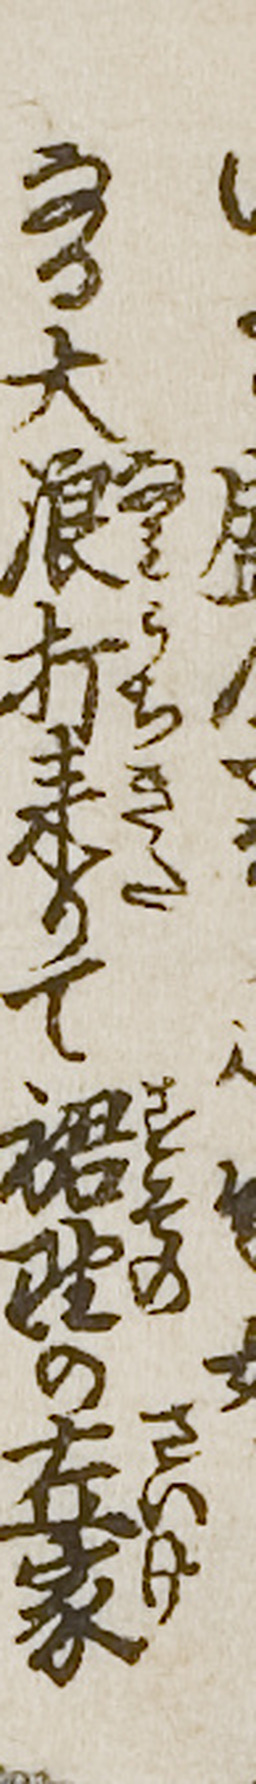なる大浪打来りて裾野の在家
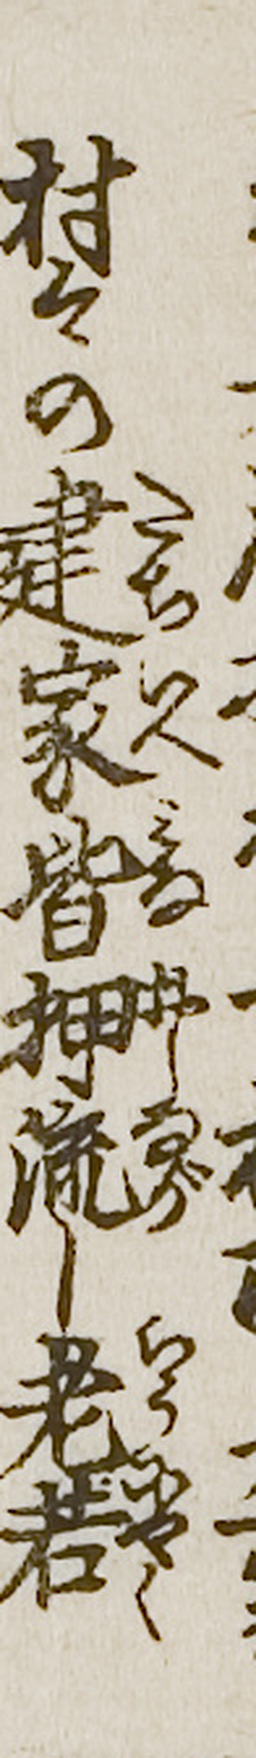村々の建家皆押流し老若
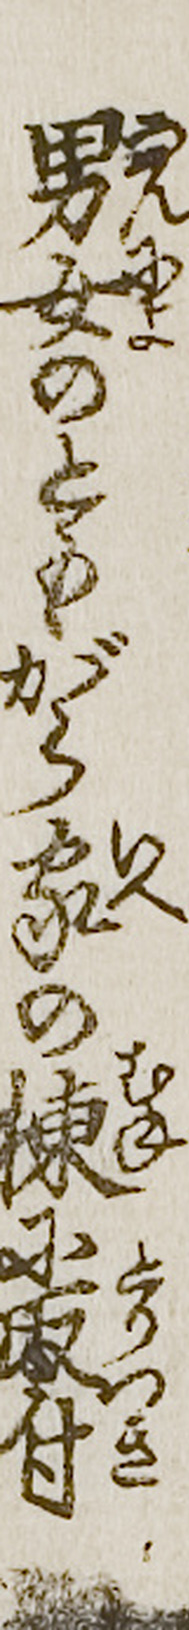男女のともがら家の棟に取付
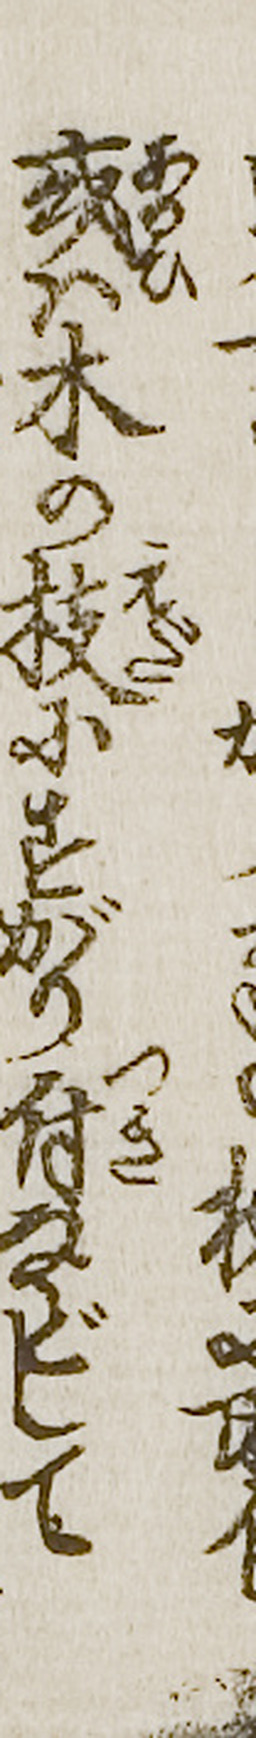或ハ木の枝にすがり付などして
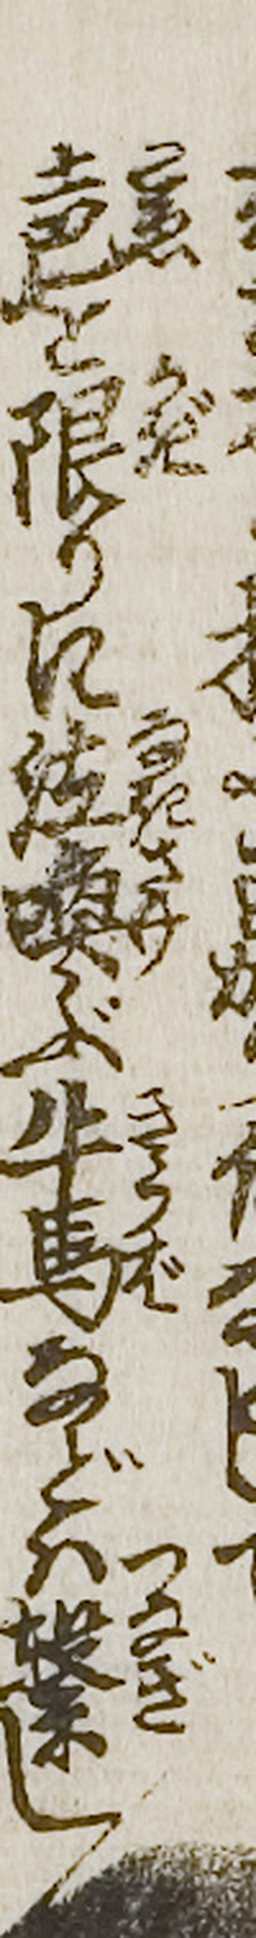声を限りに泣喚ぶ牛馬などハ繋し
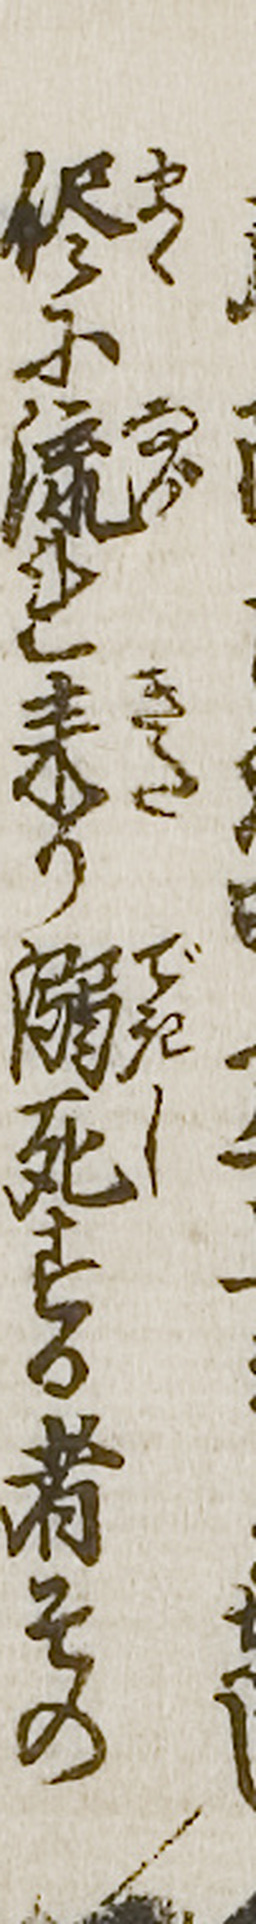侭に流れ来り溺死する者その
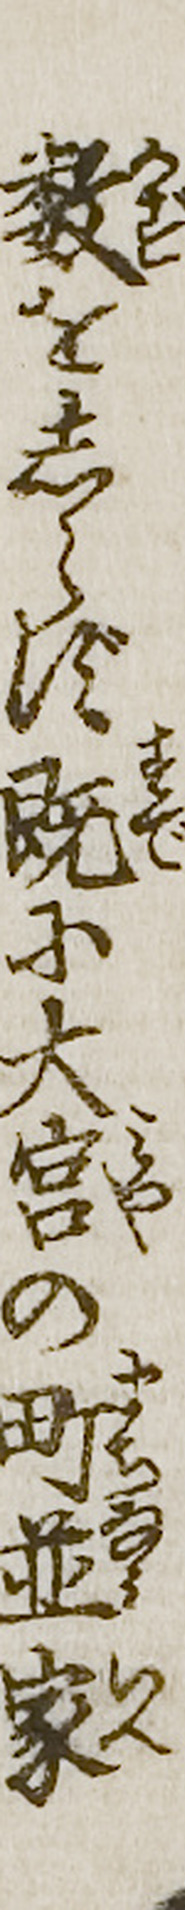数をしらず既に大宮の町並家
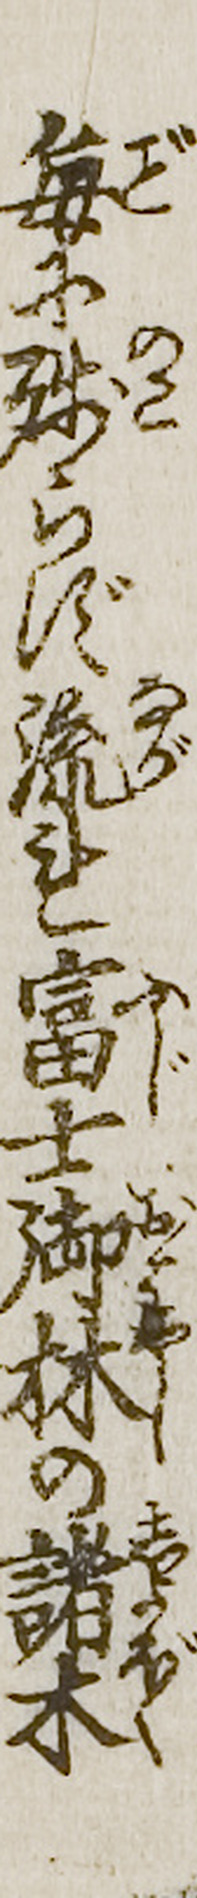毎に残らず流れ富士御林の諸木
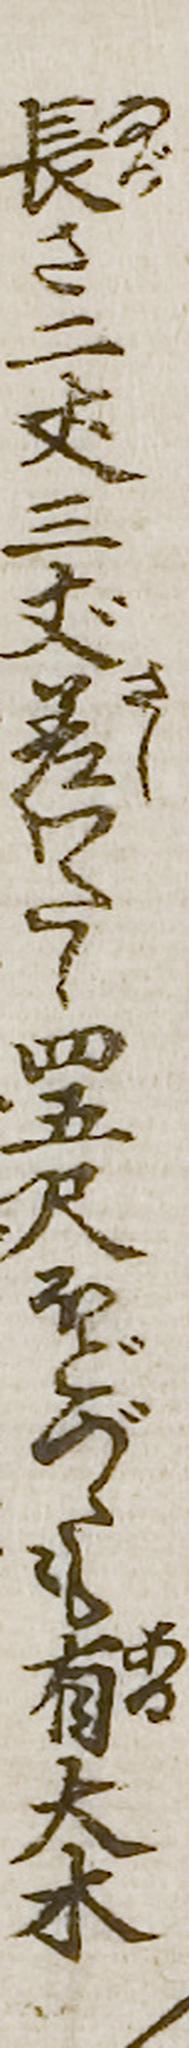長さ二丈三丈差わたし四五尺ほどづゝも有大木
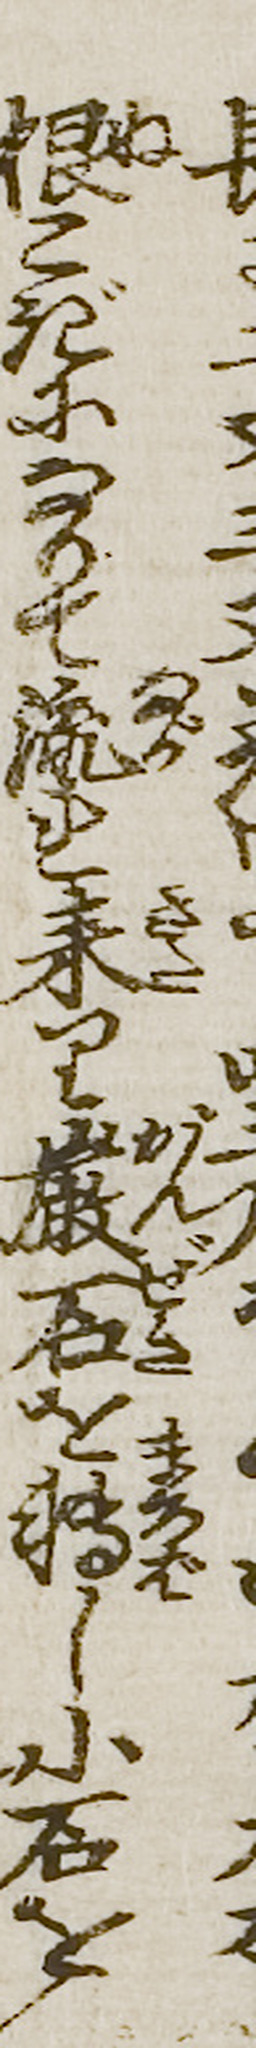根こぎになりて流れ来り巌石を轉し小石を
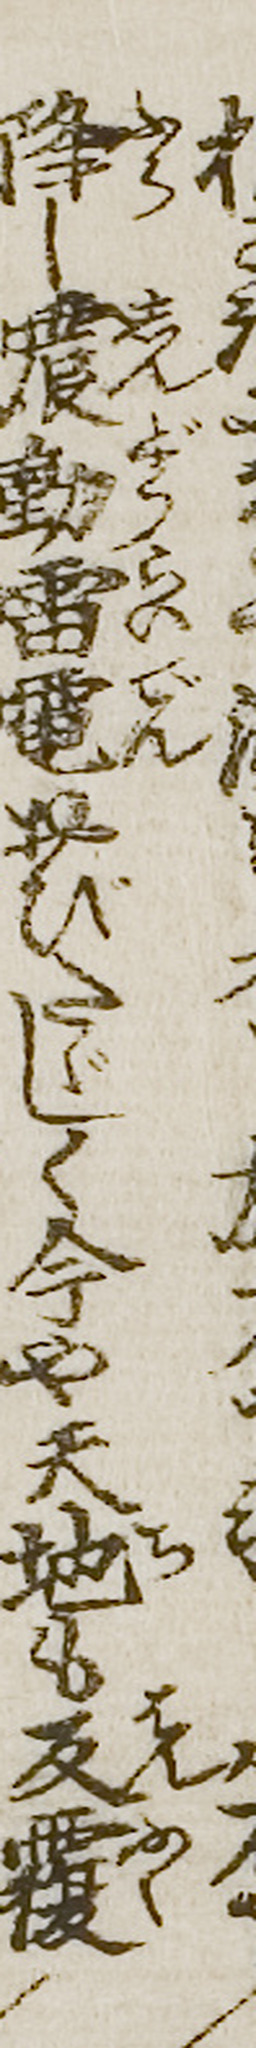降し震動雷電おびたゞしく今や天地も反覆
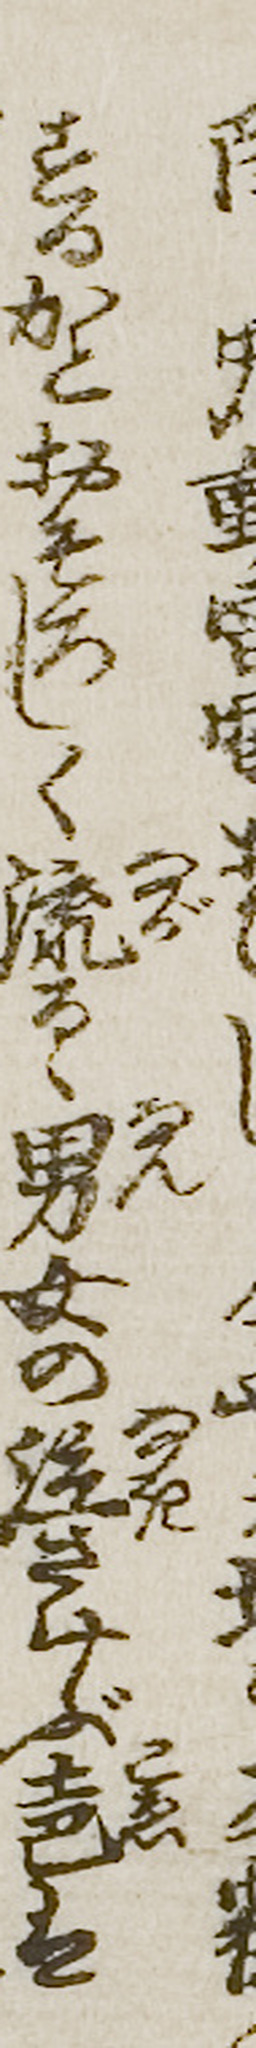するかとおそろしく流るゝ男女の泣さけぶ声は
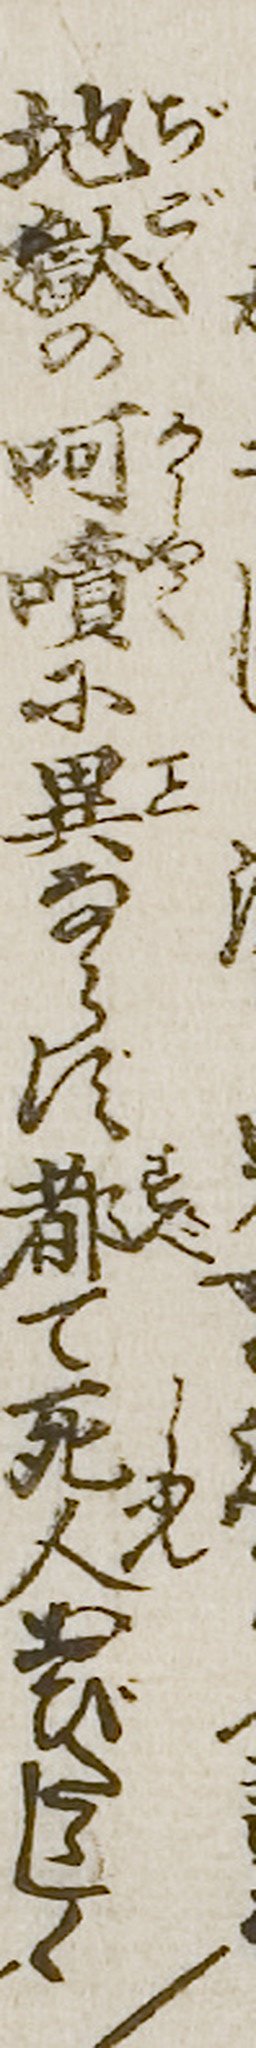地獄の呵噴に異ならず都て死人おびたゞしく
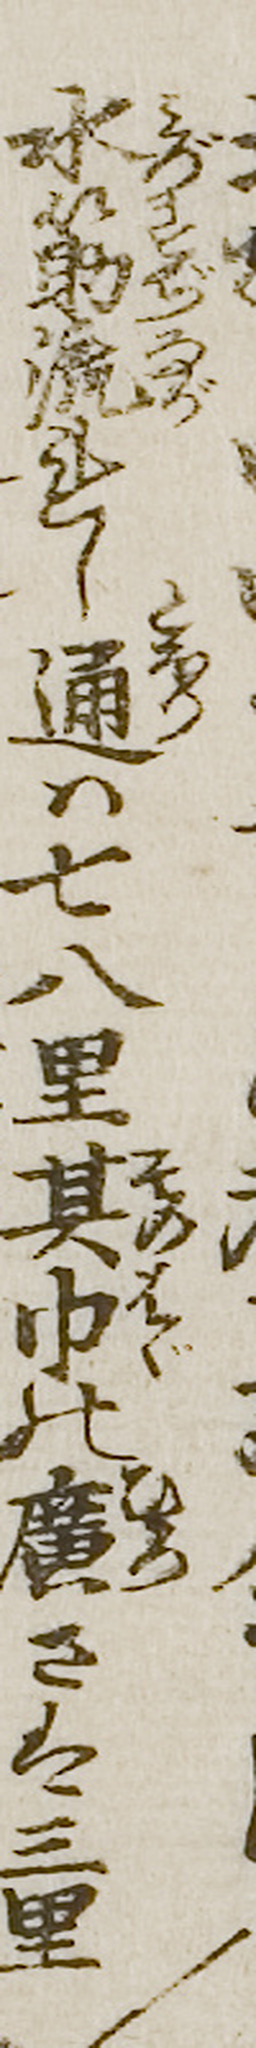水筋流れし通ハ七八里其巾の廣さは三里
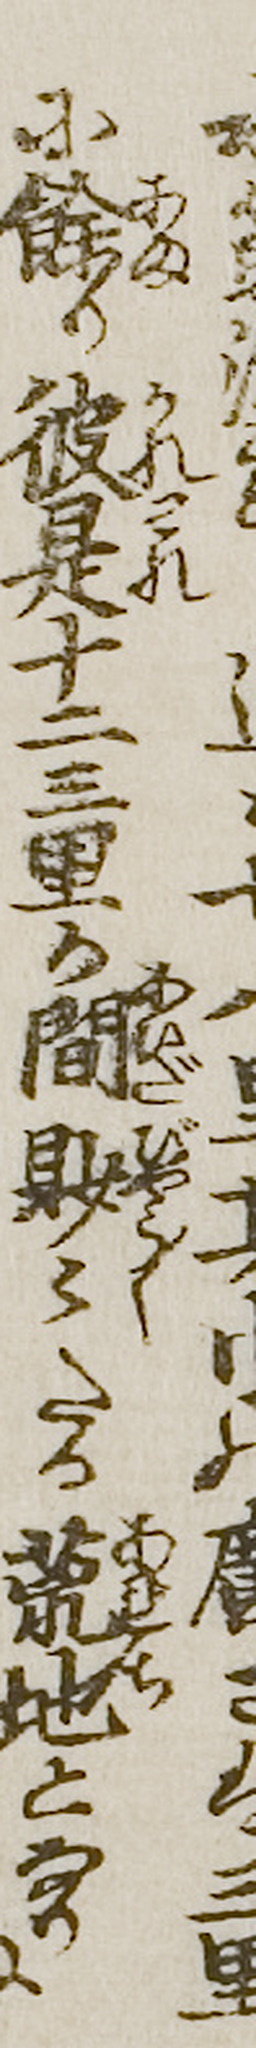に餘り彼是十二三里か間渺〻たる荒地となりぬ
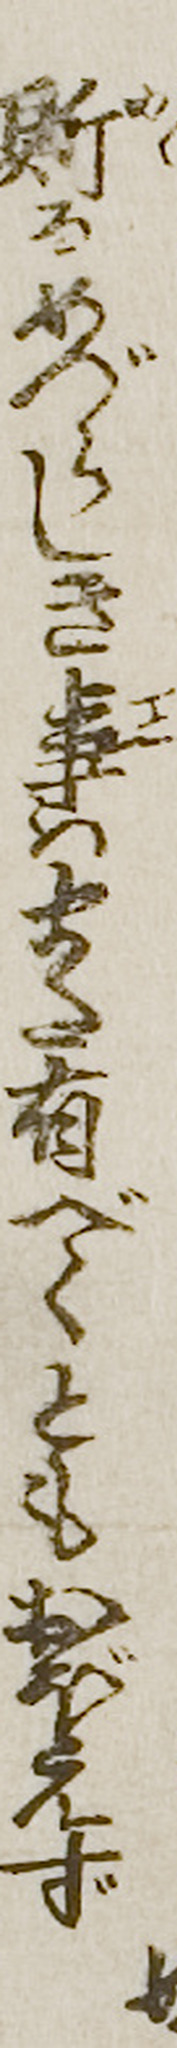斯るめづらしき事ハまた有べくともおぼえず
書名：富士山出水之図
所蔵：東京大学総合図書館 General Library in the University of Tokyo, JAPAN
